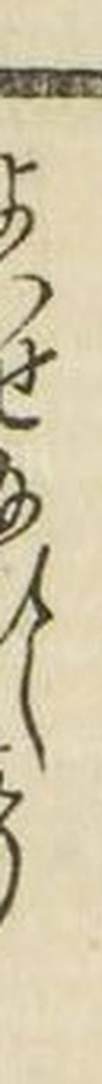よはせ給ひしより
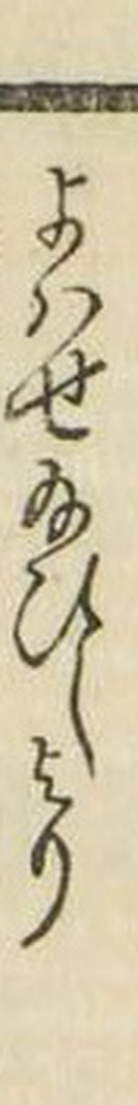よはせ給ひしより
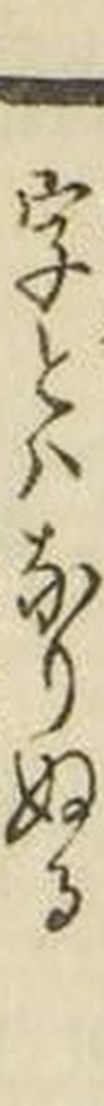字とはなりぬる
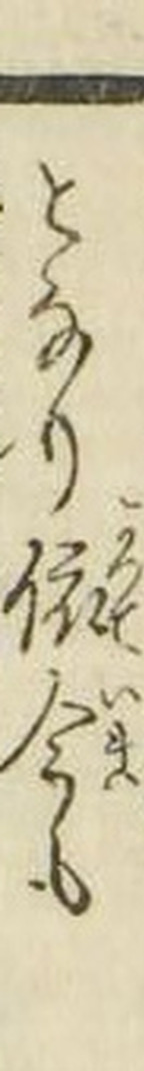となり依今も
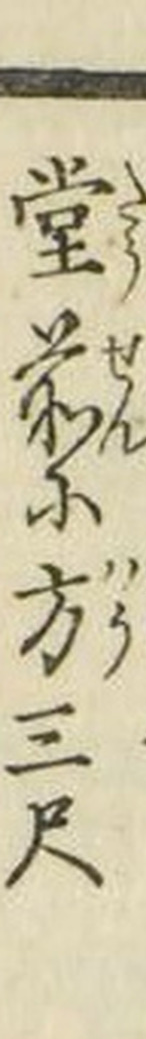堂前に方三尺
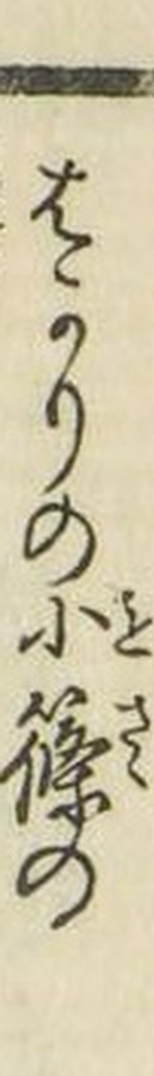はかりの小篠の
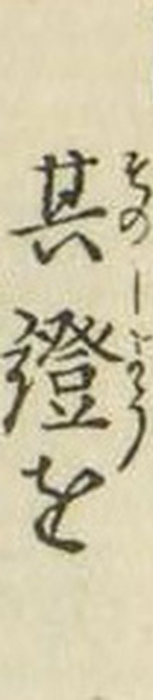其證を
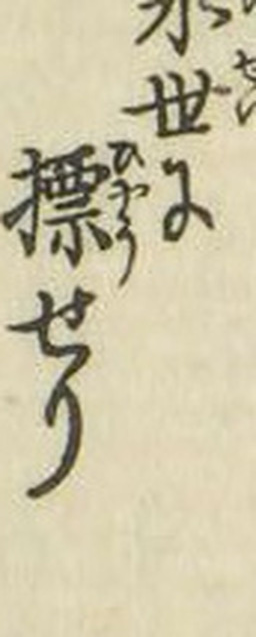標せり

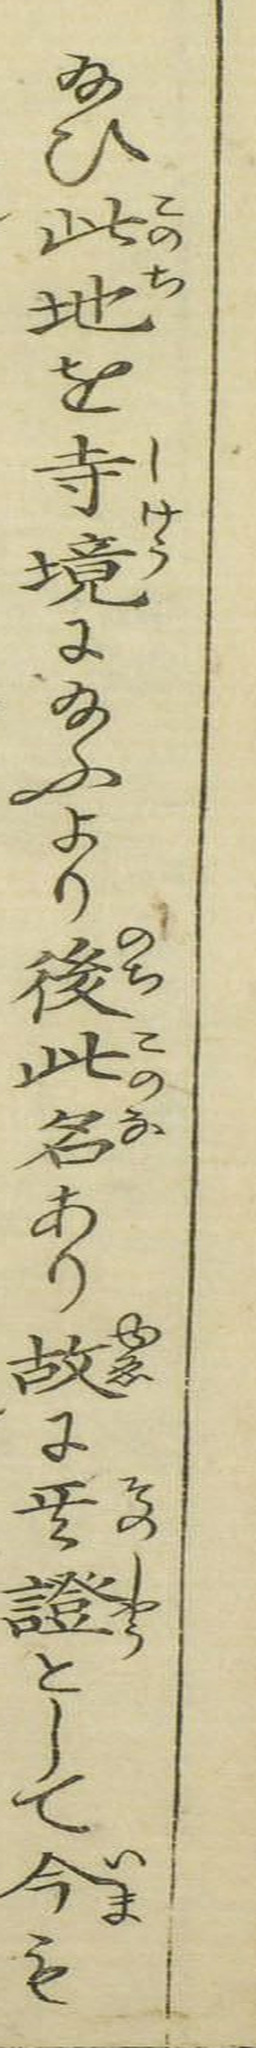給ひ此地を寺境に給ふより後此名あり故に其證として今も
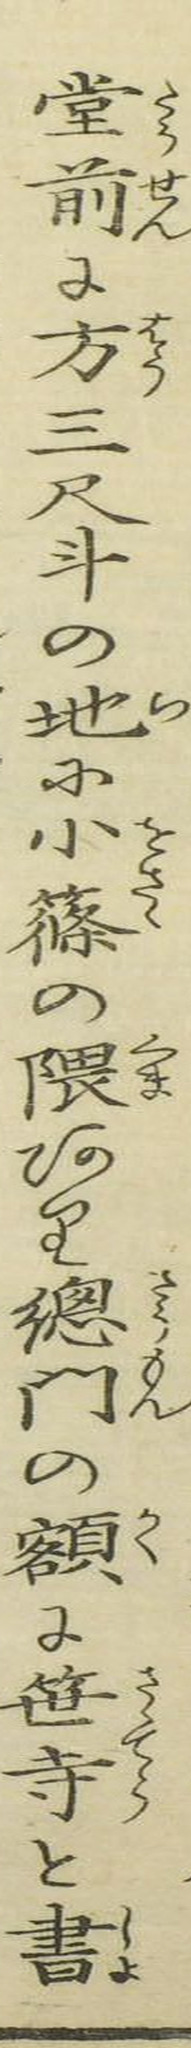堂前に方三尺斗の地に小篠の隈あり総門の額に笹寺と書
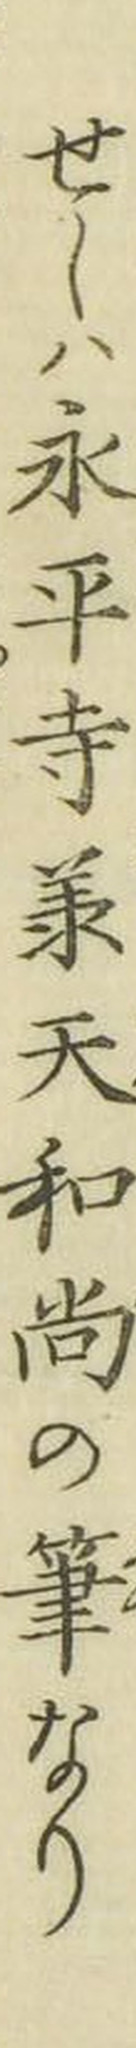せしは永平寺承天和尚の筆なり
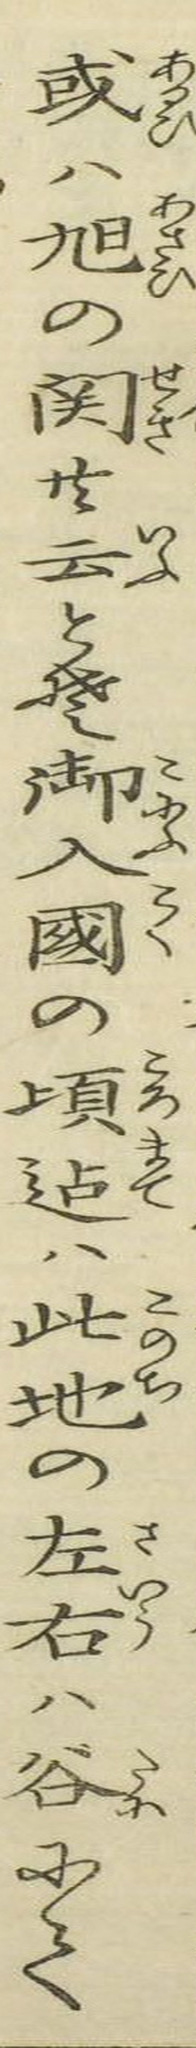或は旭の関共云とそ御入国の頃迠は此地の左右は谷にて
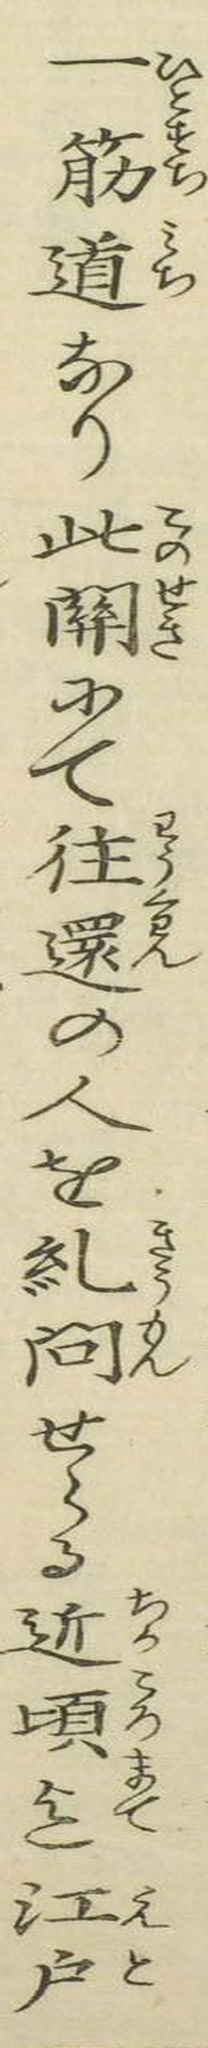一筋道なり此関にて往還の人を糾問せらる近頃迠江戸
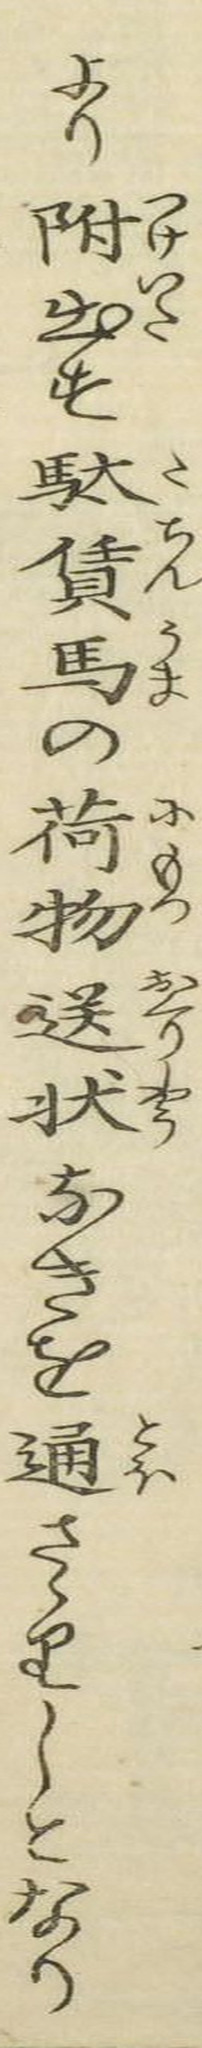より附出す駄賃馬の荷物送状なきを通さゝりしとなり
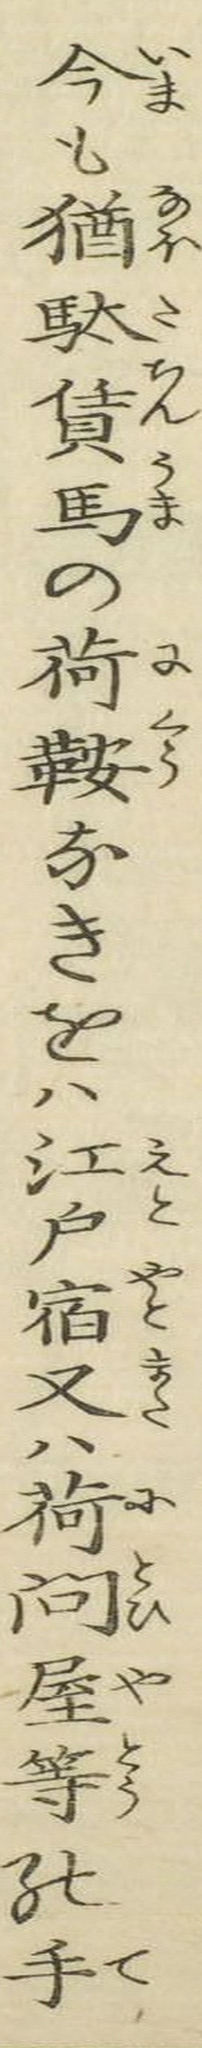今も猶駄賃馬の荷鞍なきをは江戸宿又は荷問屋等の手
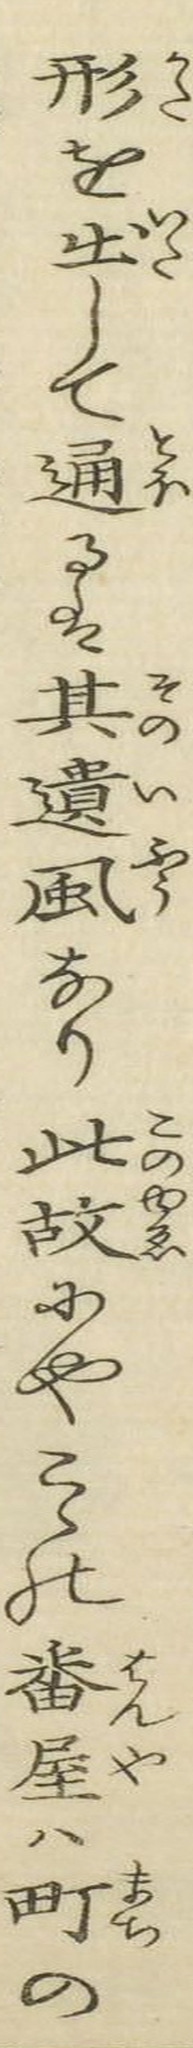形を出して通るは其遺風なり此故にやこゝの番屋は町の
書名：江戸名所図会 20巻 巻之9
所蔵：東京学芸大学教育コンテンツアーカイブ
